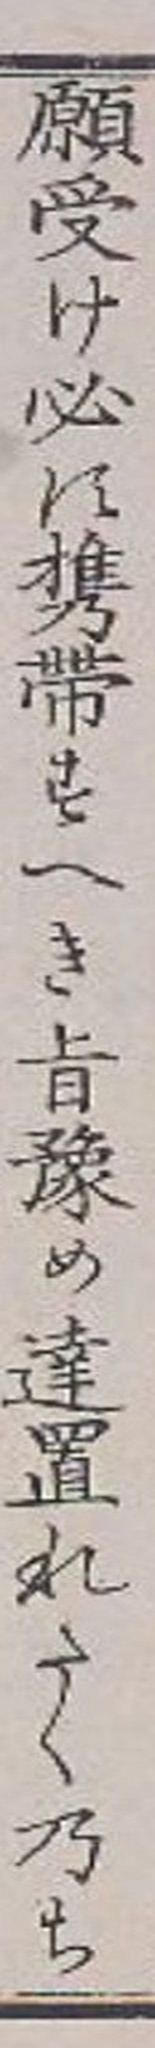願受け必す携帯すへき旨予め達置れたく乃ち
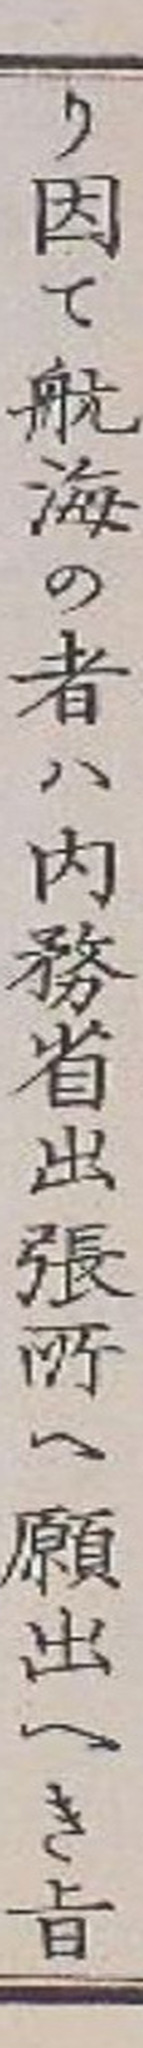り因て航海の者は内務省出張所へ願出へき旨
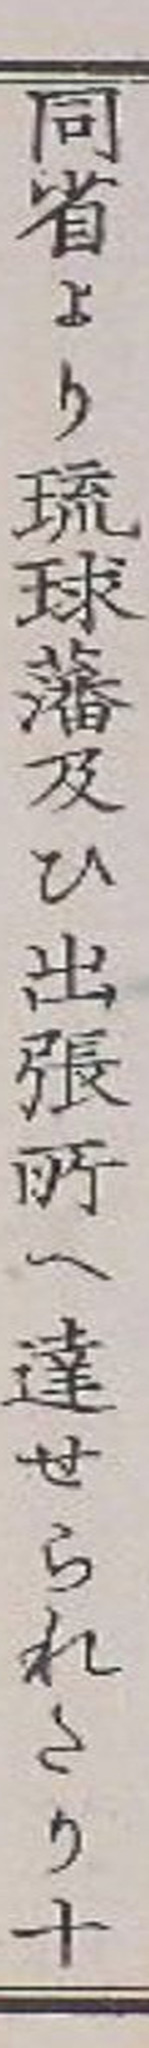同省より琉球藩及ひ出張所へ達せられたり十
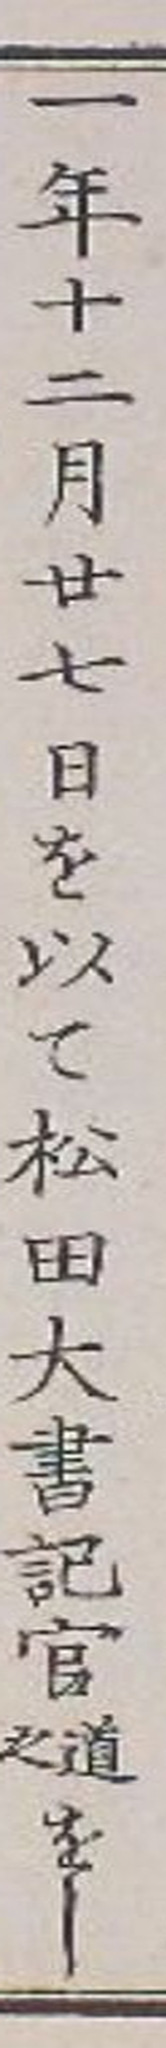一年十二月廿七日を以て松田大書記官道之をし
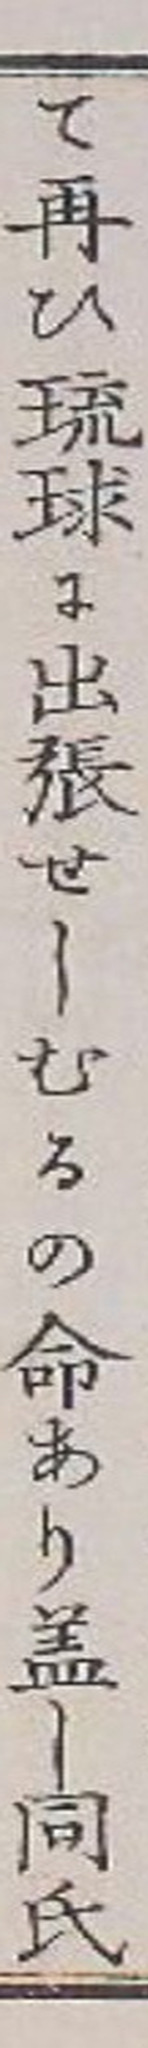て再ひ琉球に出張せしむるの命あり盖し同氏
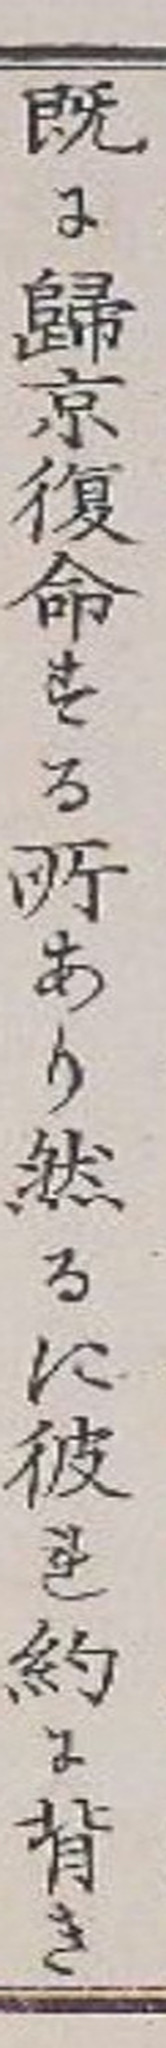既に帰京復命する所あり然るに彼れ約に背き
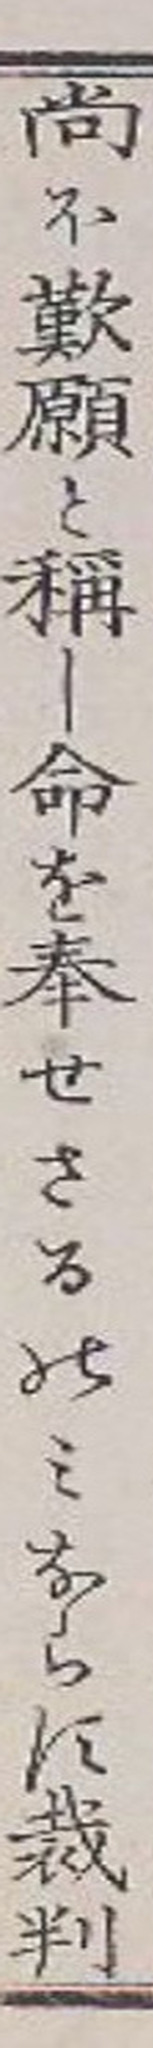尚ほ歎願と称し命を奉せさるのみならす裁判
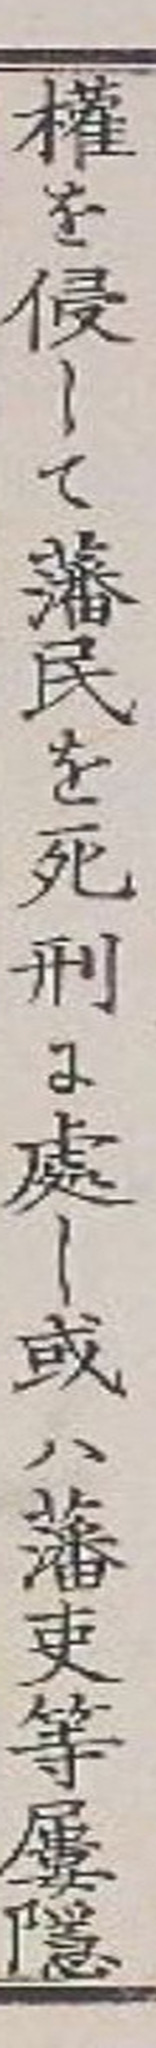権を侵して藩民を死刑に処し或は藩吏等屢隠
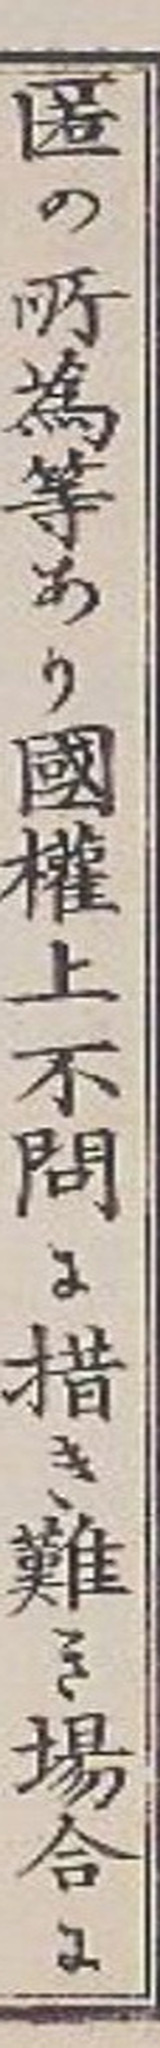匿の所為等あり国権上不問に措き難き場合に
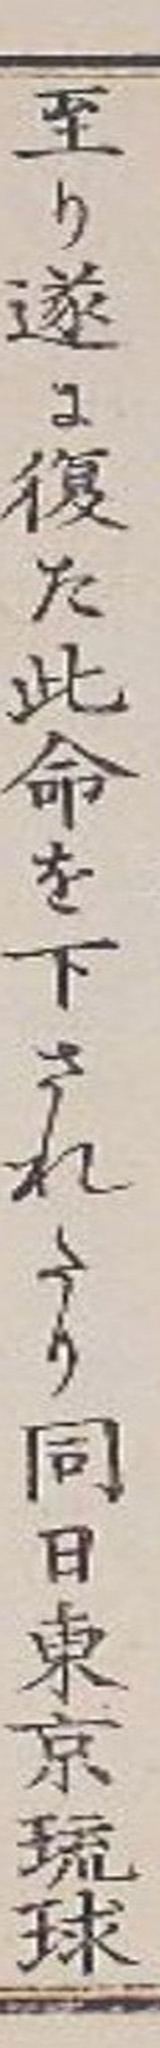至り遂に復た此命を下されたり同日東京琉球
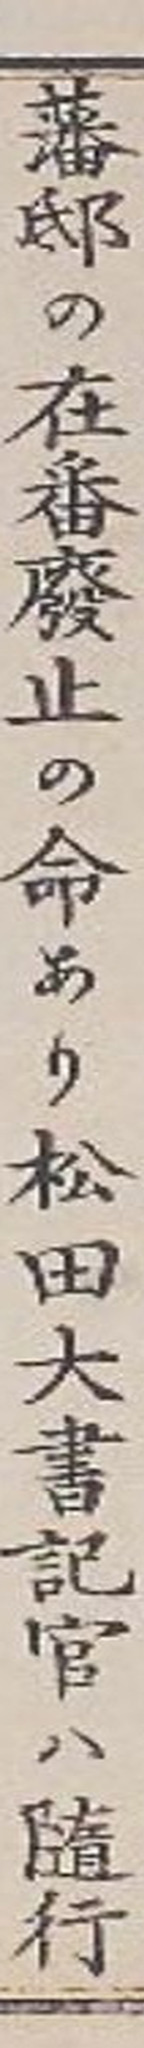藩邸の在番廃止の命あり松田大書記官は随行
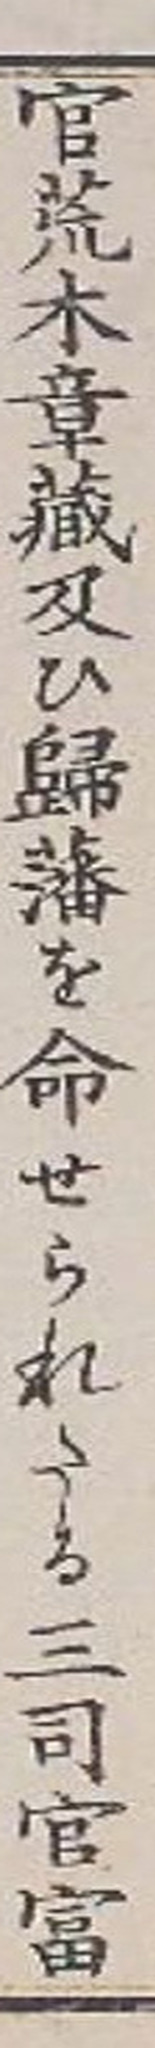官荒木章蔵及ひ帰藩を命せられたる三司官富
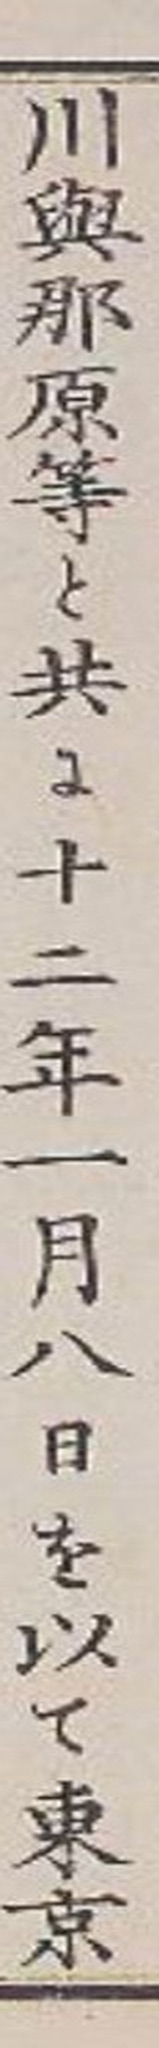川与那原等と共に十二年一月八日を以て東京
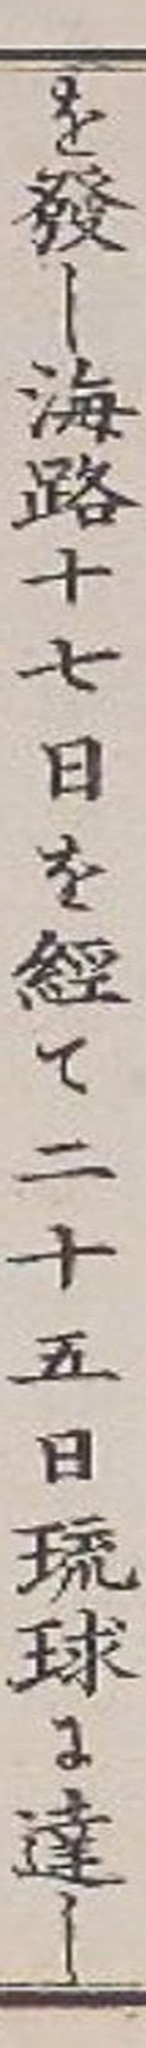を発し海路十七日を経て二十五日琉球に達し
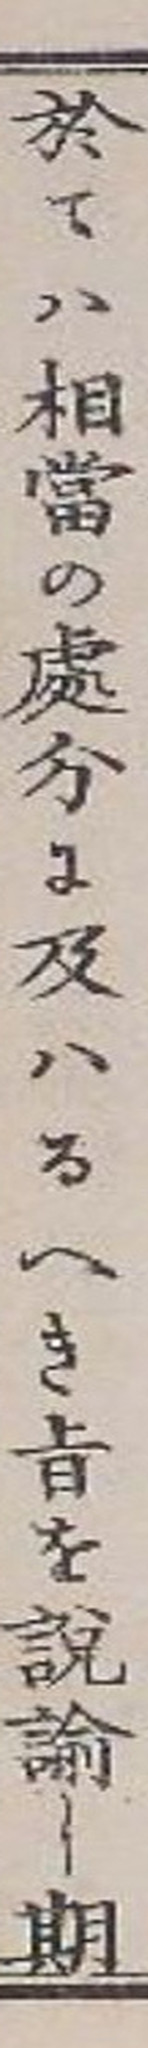於ては相当の処分に及はるへき旨を説諭し期

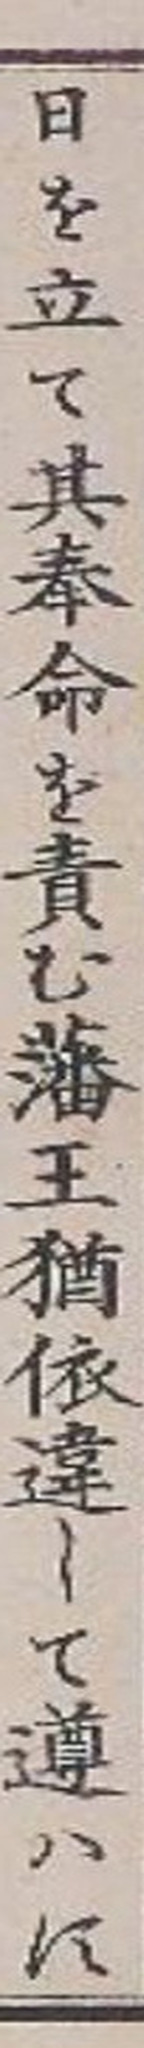日を立て其奉命を責む藩王猶依達して遵はす
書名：南島紀事 下
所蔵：University of the Ryukyus Library
